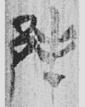邦
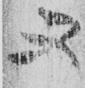又（有）
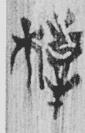○（悍）
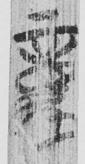童
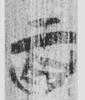百
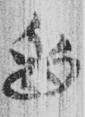眚（姓）
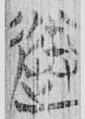送
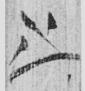之
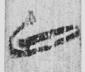㠯（以）
